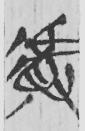虘B
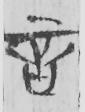言
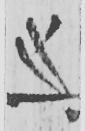之
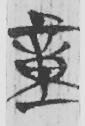童
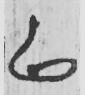㠯（以）
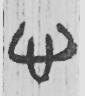心
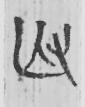{亡又}
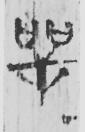咢
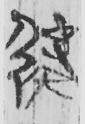{弓夬矢}
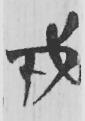戎
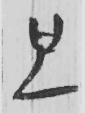也
